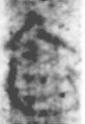裏
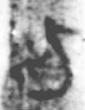紫
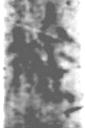○（錦）
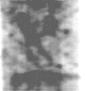之
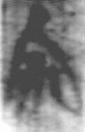安（鞍）
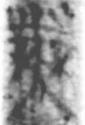無
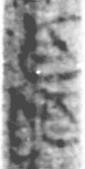○（攝）
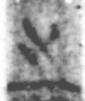之
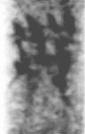無
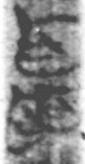○（攝）
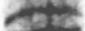一
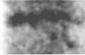一
